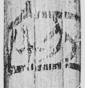庭
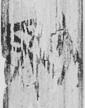則
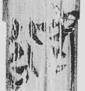欲
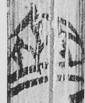齊齊
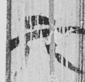亓（其）
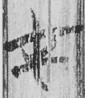才（在）
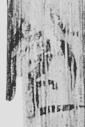堂
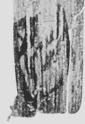則
